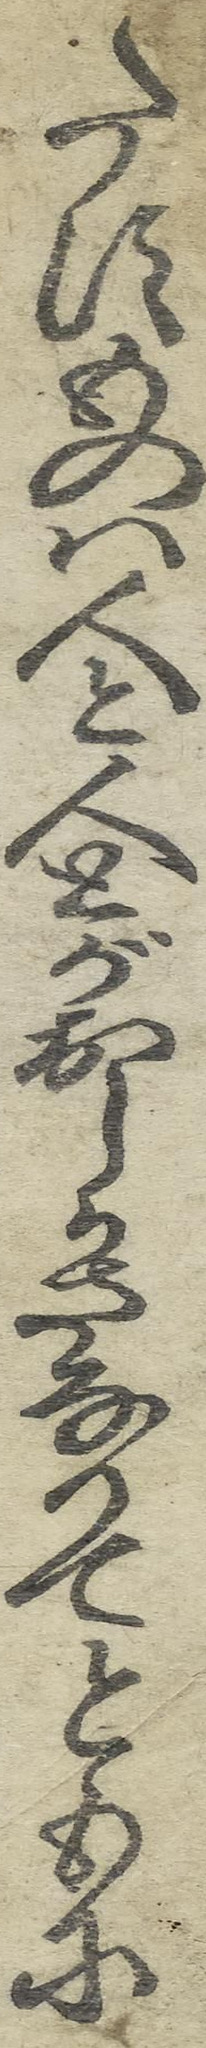たすものは人と人とがおしかさなりてともに
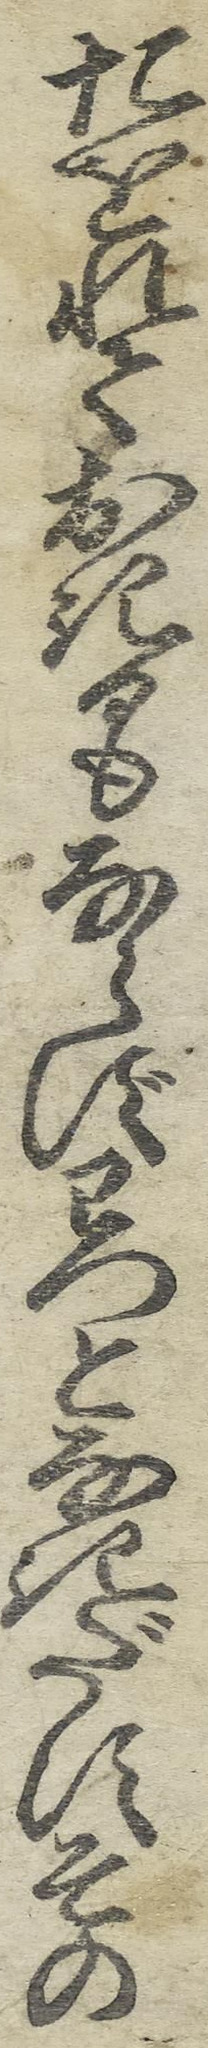たをれておきるもならずわつとなきだすその
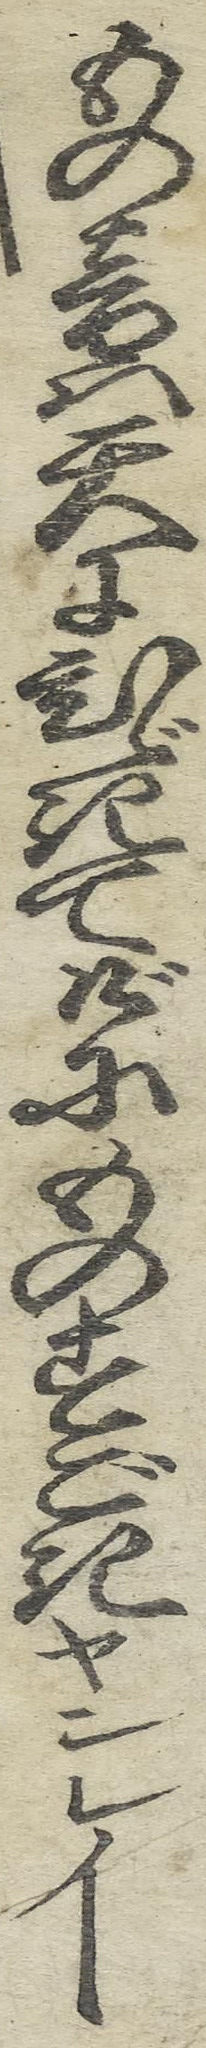もの音は天にひゞきてげにものすごきヤンレイ
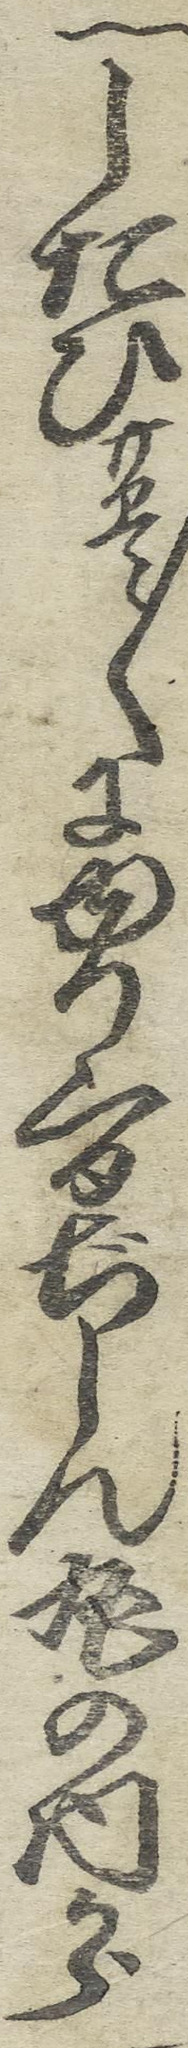〽したひサアて〳〵にゆりくるぢしん丸の内から
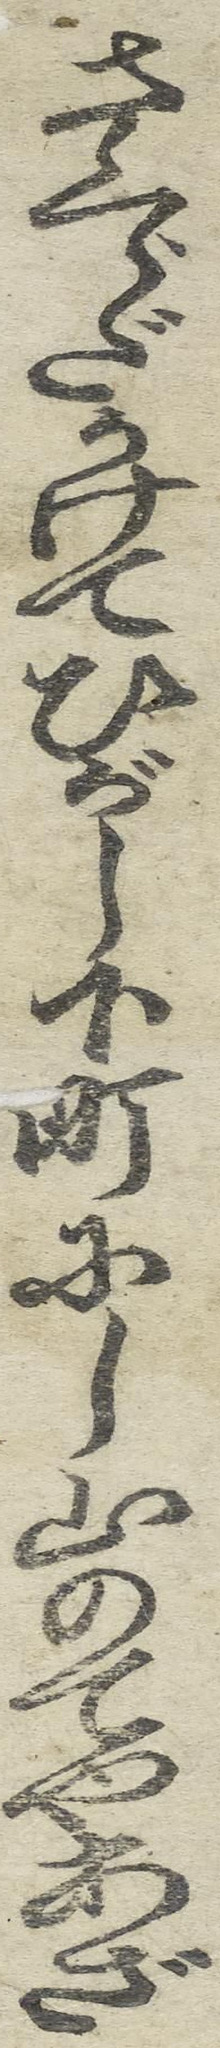さくらだかけてひがし下町にし山のてやあざ
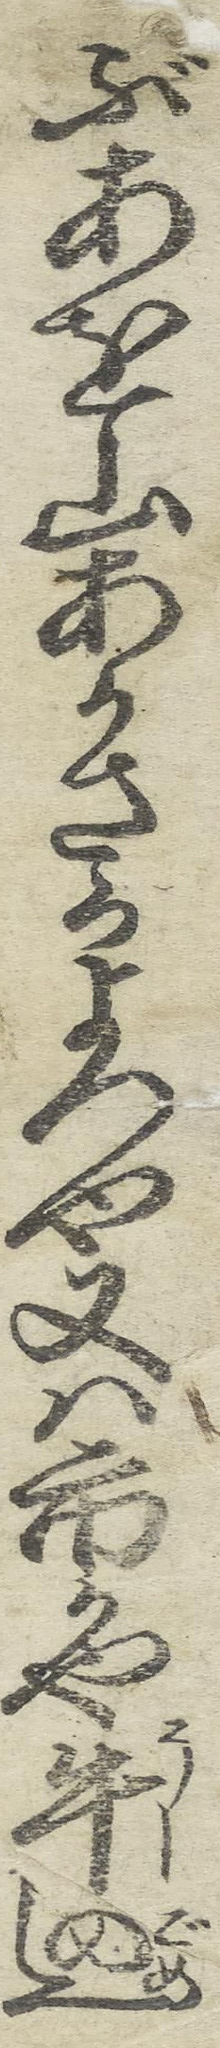ぶあを山あかさかよつや又は市かや牛込
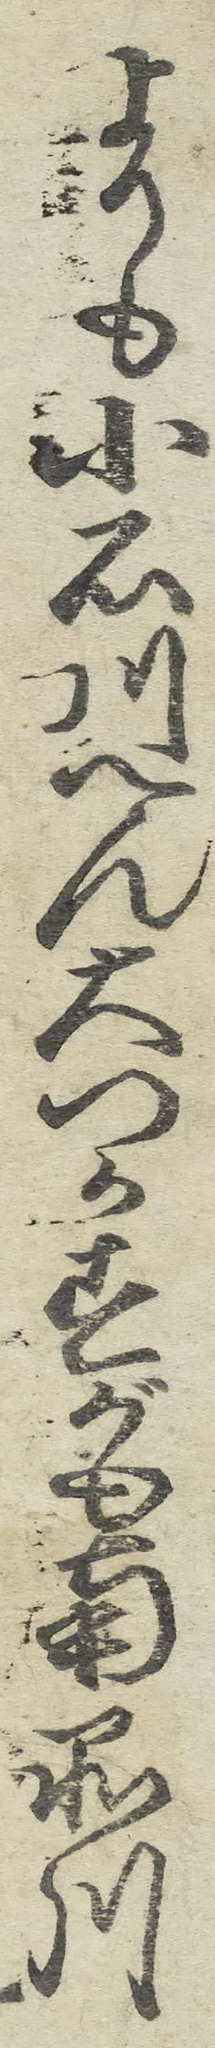よりも小石川へん大つかすがも南品川
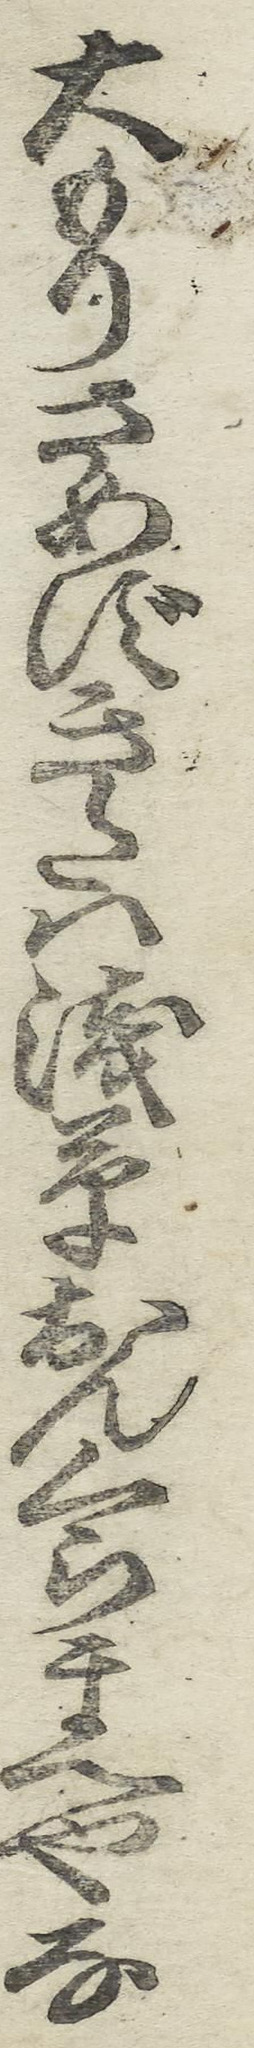大もりさめずきたは浅草おんくらまへやな
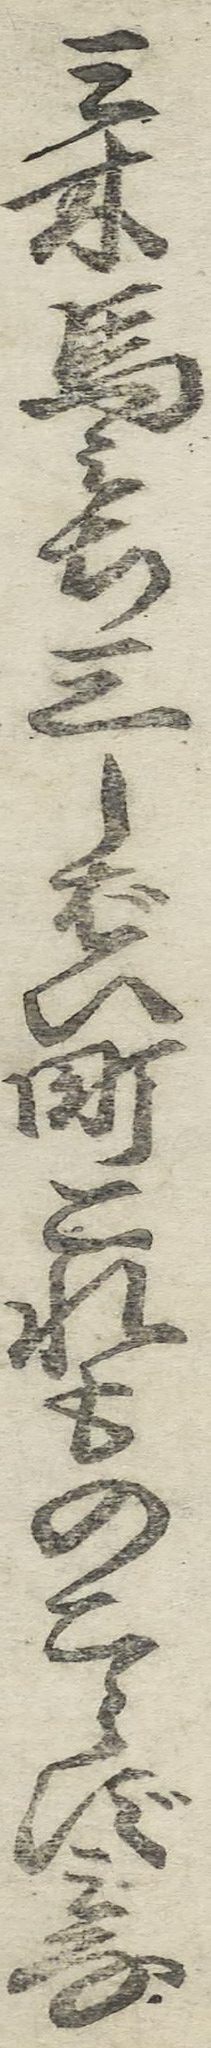三木馬みち三しばい町これものこらずみな
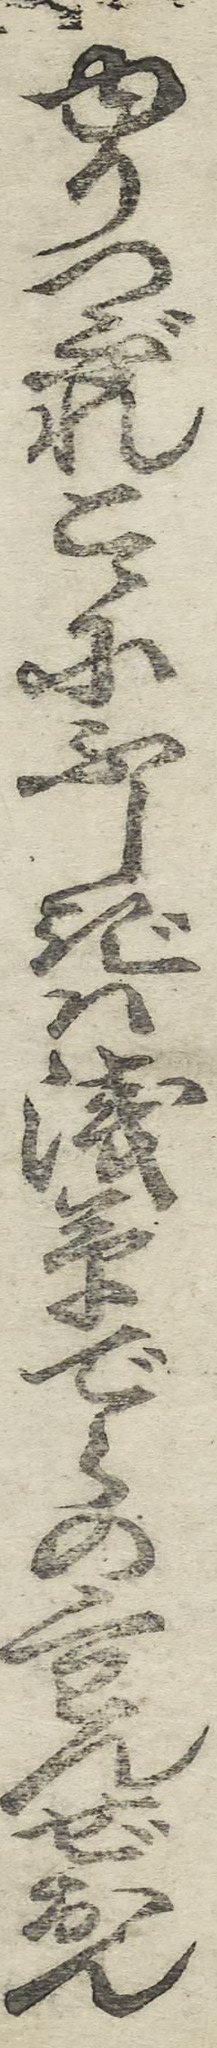ゆりつぶれこゝにふしぎは浅草でらのくわんぜおん
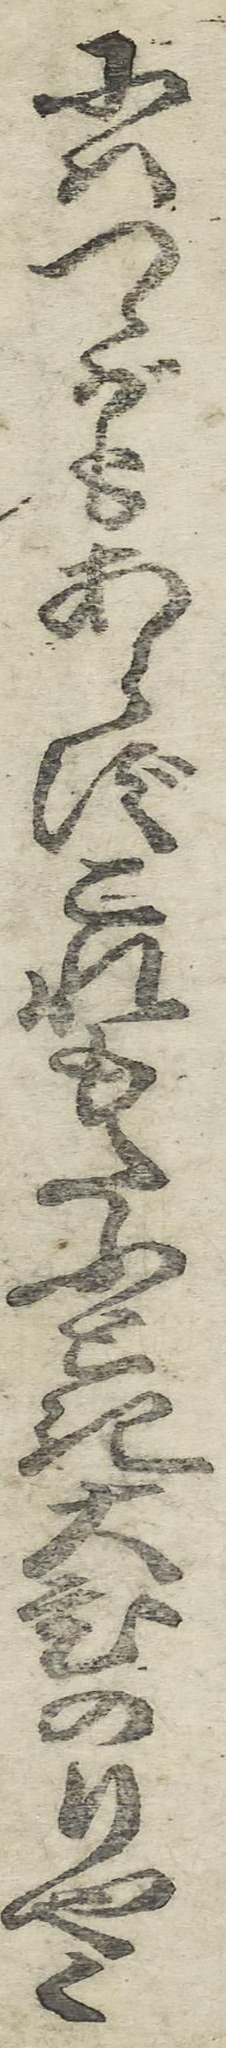にはつゝがもあらずこれもたふとき大ひのりやく
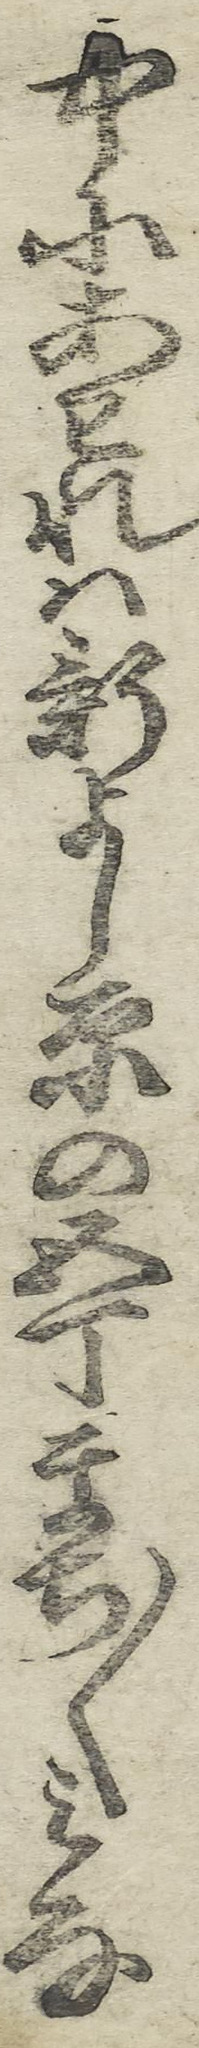中にあわれは新よし原の五丁まち〳〵みな
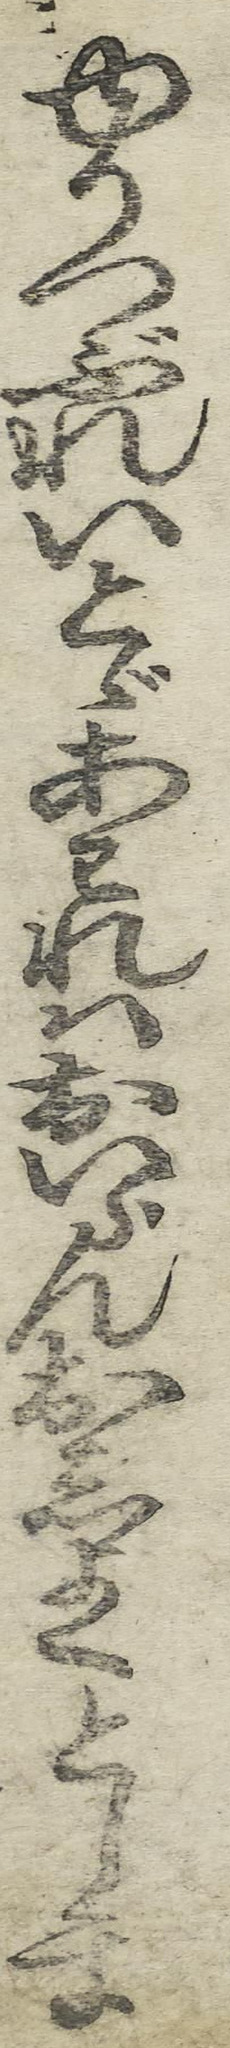ゆりつぶれいとゞあわれはおいらんおしよくとしま
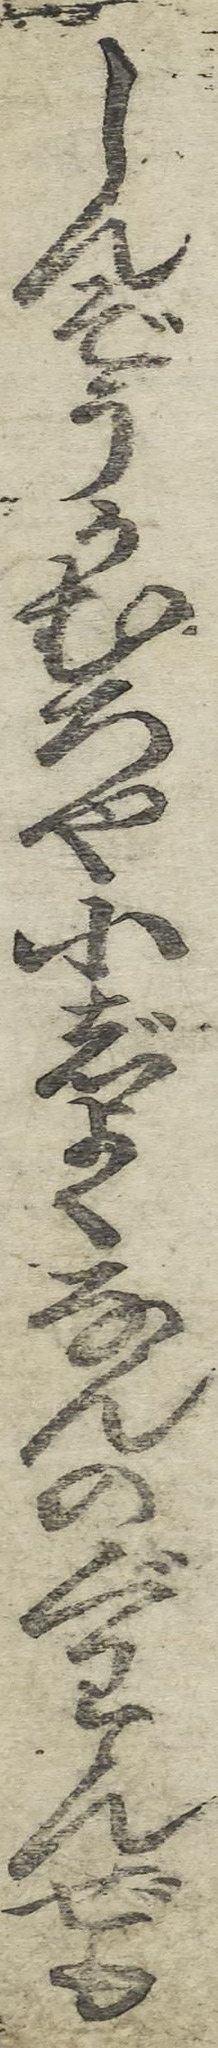しんぞうかむろや小じよくなんのぐわんぜも
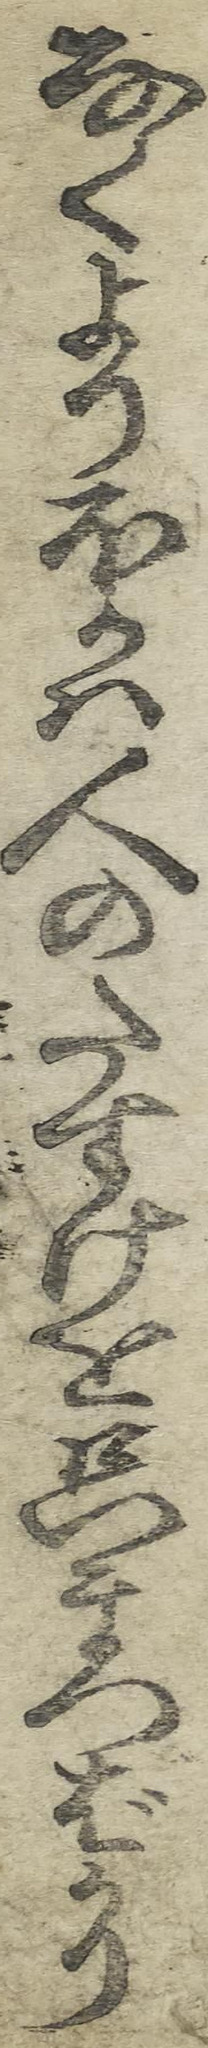なくよりほかは人のたすけを只まつばかり
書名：地震くどき　上・下
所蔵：東京大学地震研究所図書室 Earthquake Research Institute Library, The University of Tokyo, JAPAN
